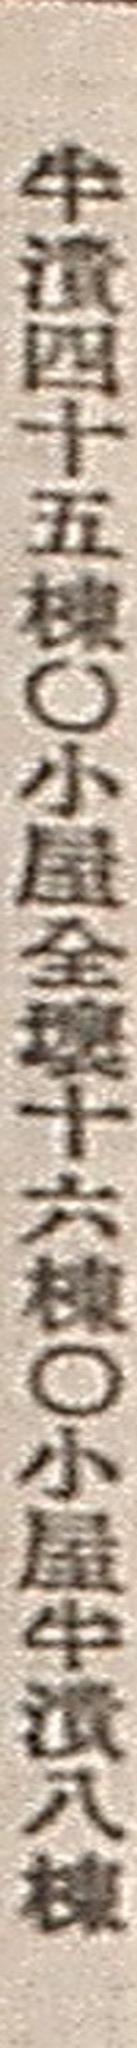半潰四十五棟〇小屋全壊十六棟〇小屋半潰八棟
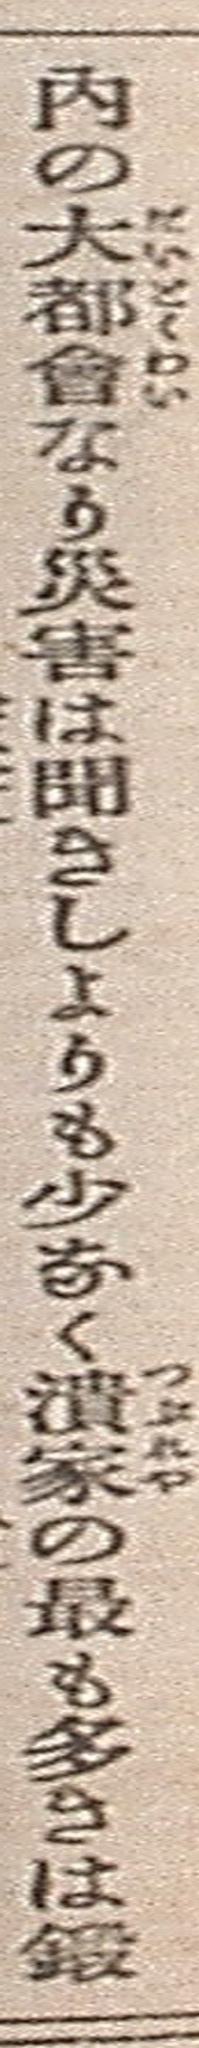内の大都会なり災害は聞きしよりも少なく潰家の最も多きは鍛
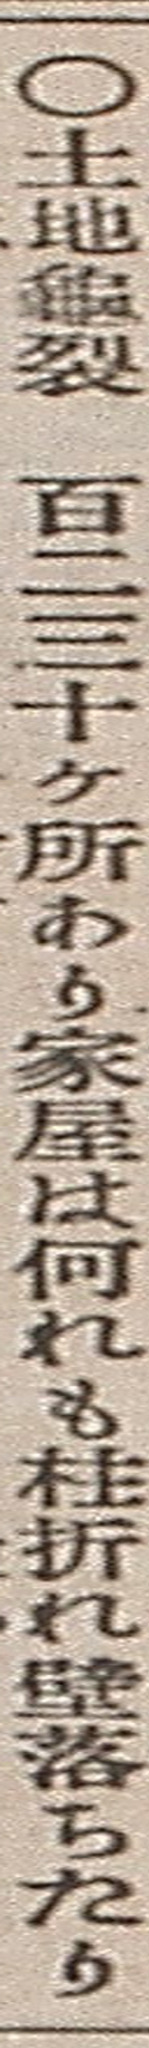〇土地亀裂百二三十ケ所あり家屋は何れも柱折れ壁落ちたり
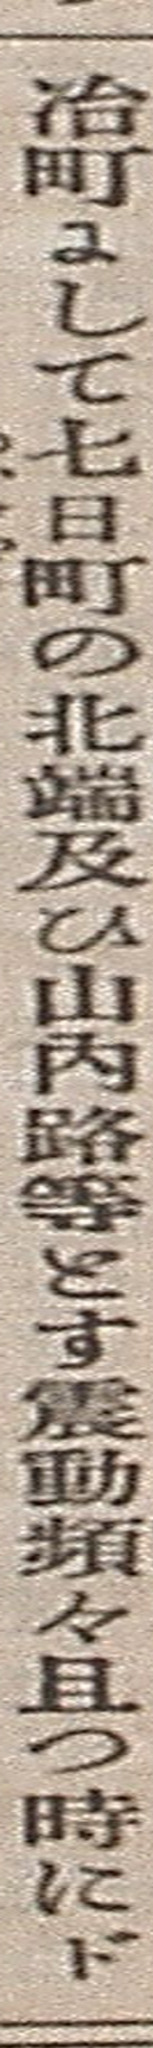冶町にして七日町の北端及ひ山内路等とす震動頻々且つ時にド
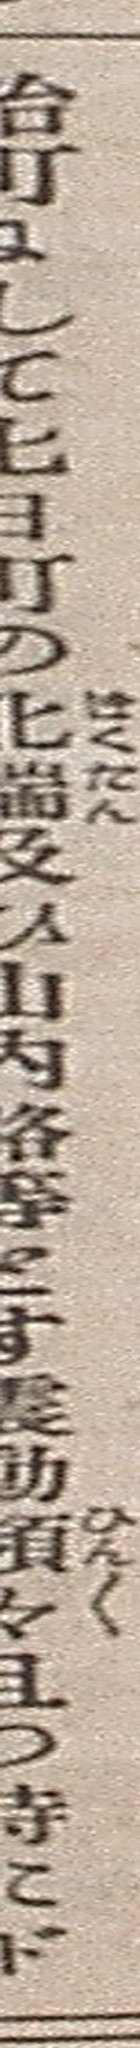冶町にして七日町の北端及ひ山内路等とす震動頻々且つ時にド
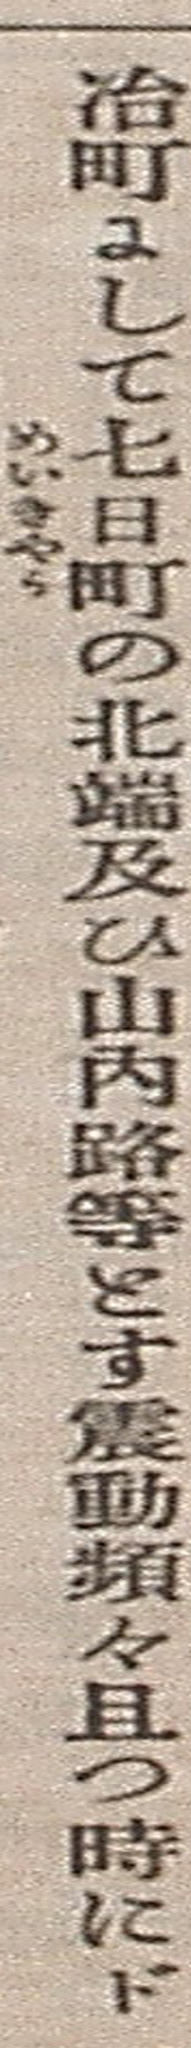冶町にして七日町の北端及ひ山内路等とす震動頻々且つ時にド
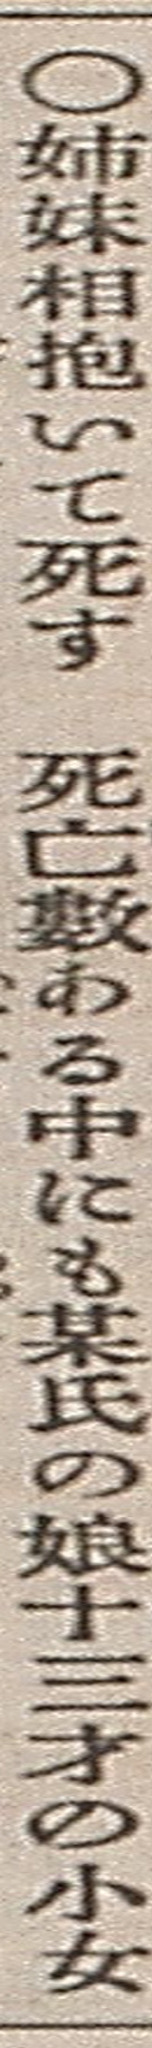〇姉妹相抱いて死す死亡数ある中にも某氏の娘十三才の小女
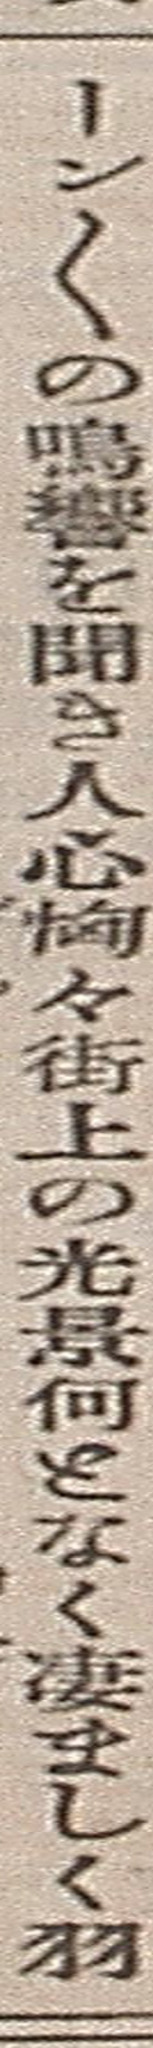ーン〳〵の鳴響を聞き人心恟々街上の光景何となく凄ましく羽
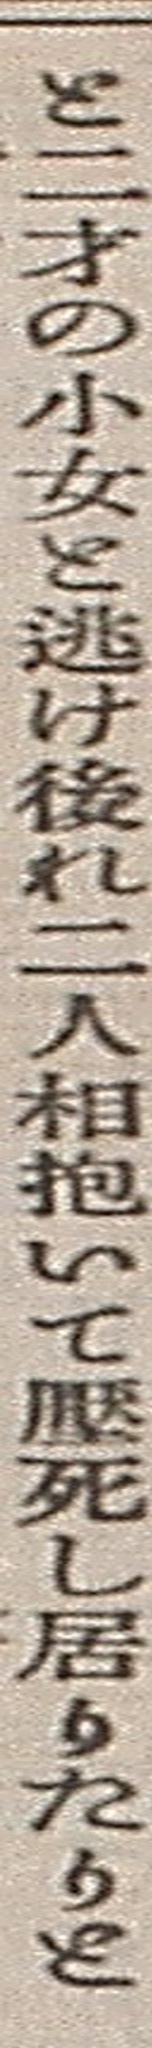と二才の小女と逃け後れ二人相抱いて圧死し居りたりと
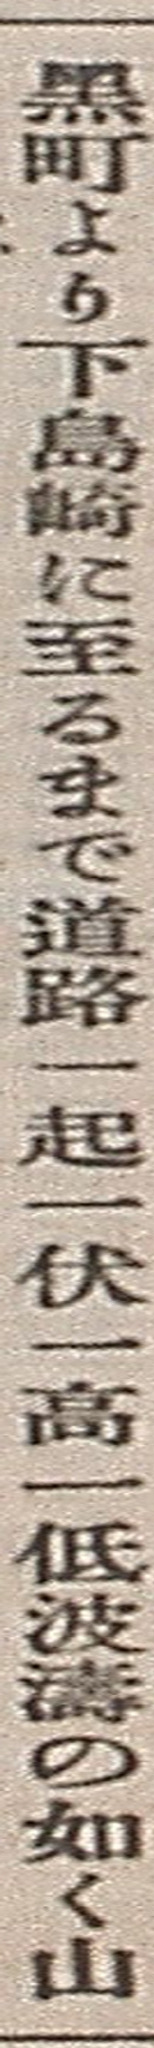黒町より下島崎に至るまで道路一起一伏一高一低波濤の如く山
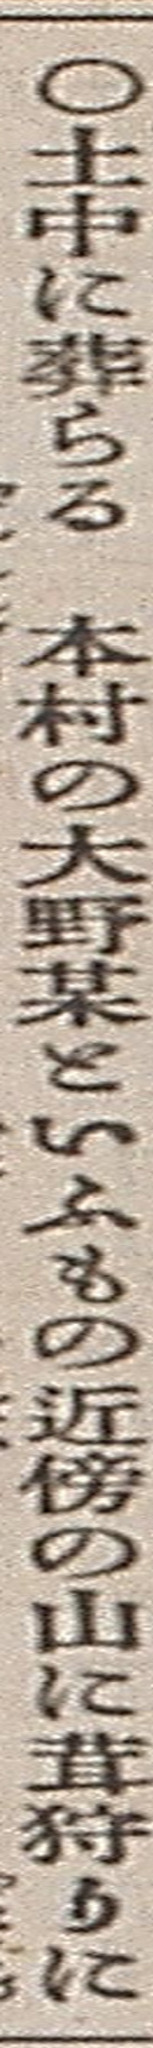〇土中に葬らる本村の大野某といふもの近傍の山に茸狩りに
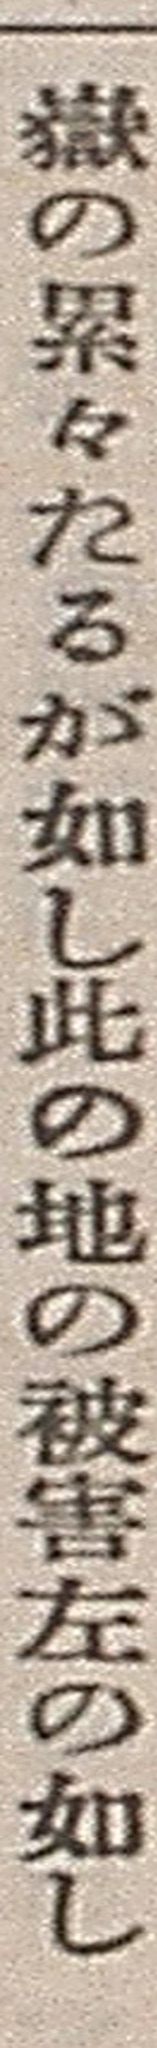嶽の累々たるが如し此の地の被害左の如し
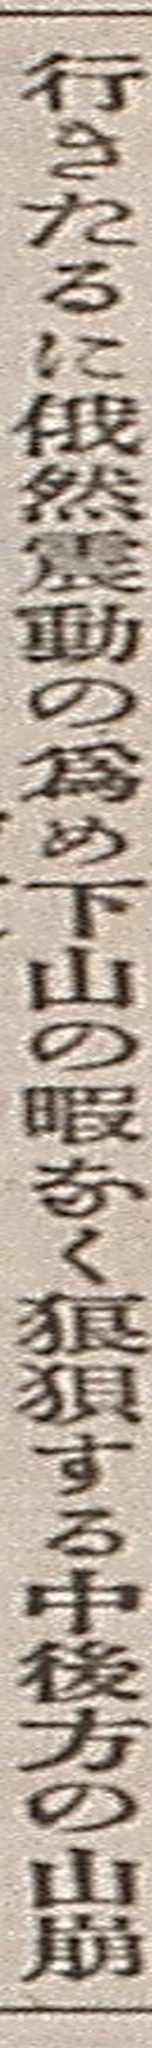行きたるに俄然震動の為め下山の暇なく狼狽する中後方の山崩
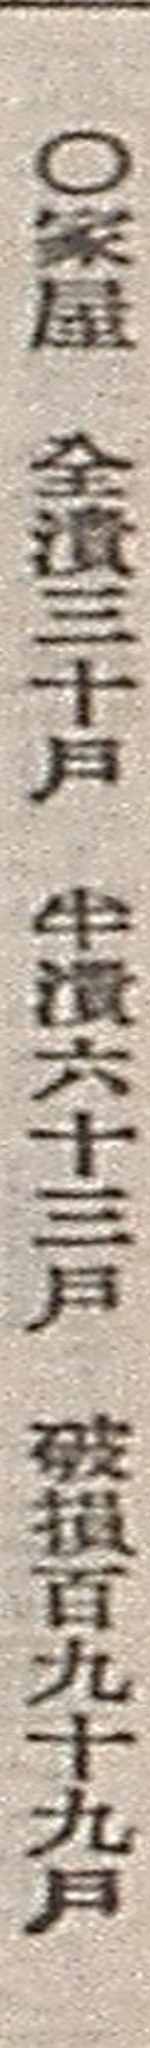〇家屋全潰三十戸半潰六十三戸破損百九十九戸
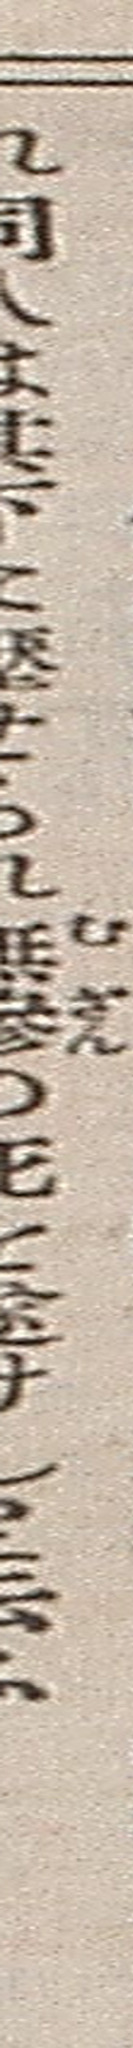れ同人は其下に圧せられ無惨の死を遂けしと云ふ
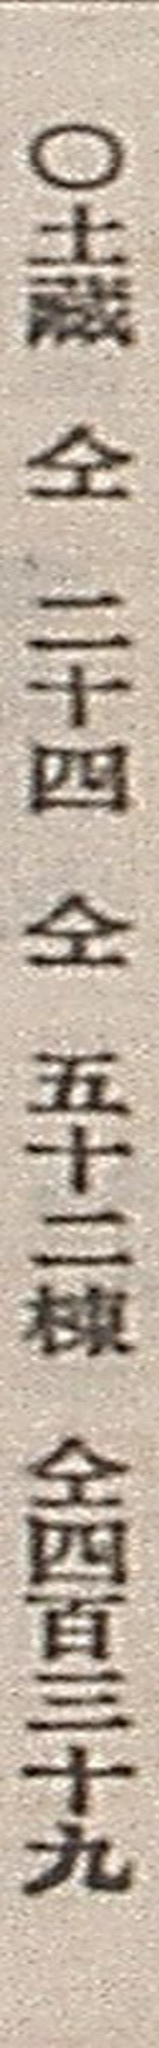〇土蔵仝二十四仝五十二棟仝四百三十九
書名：風俗畫報臨時増刊第百二十四號　洪水地震被害録（上）
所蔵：東京大学地震研究所図書室 Earthquake Research Institute Library, The University of Tokyo, JAPAN
